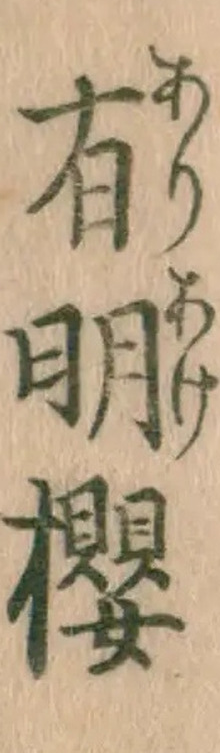有明桜

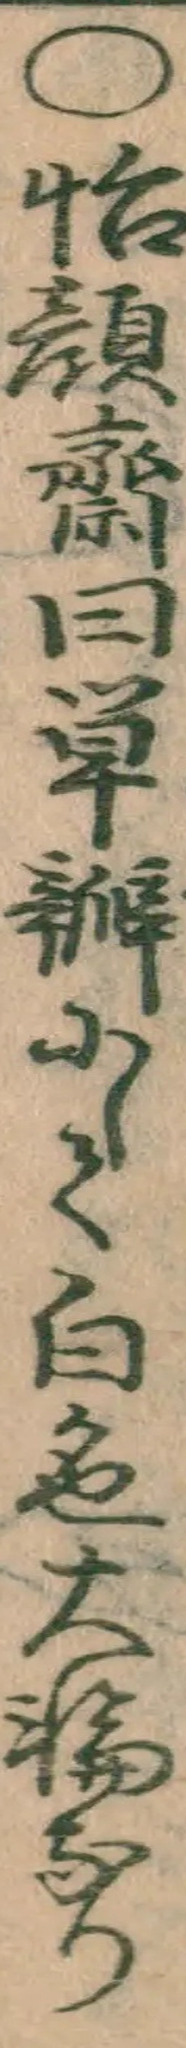○怡顔斎曰単弁にして白色大輪なり
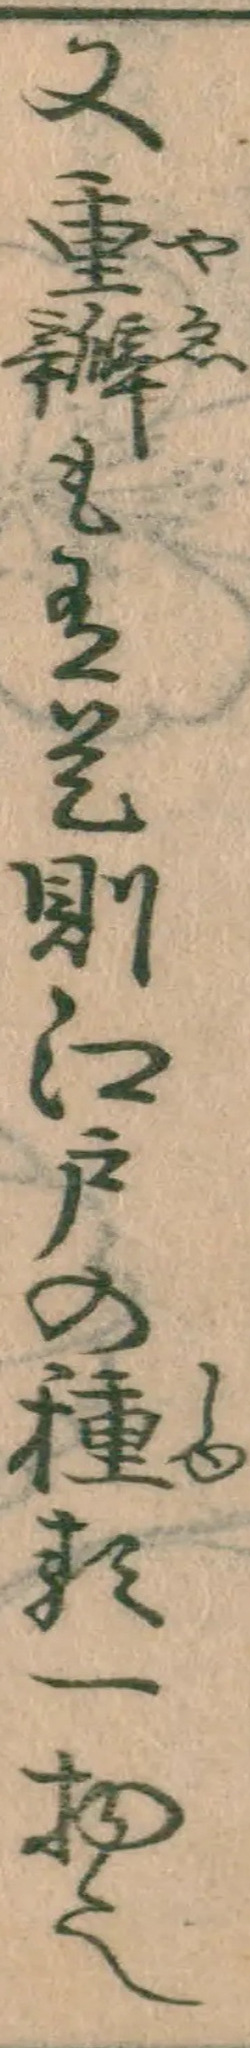又重弁も有是則江戸の種類一物也
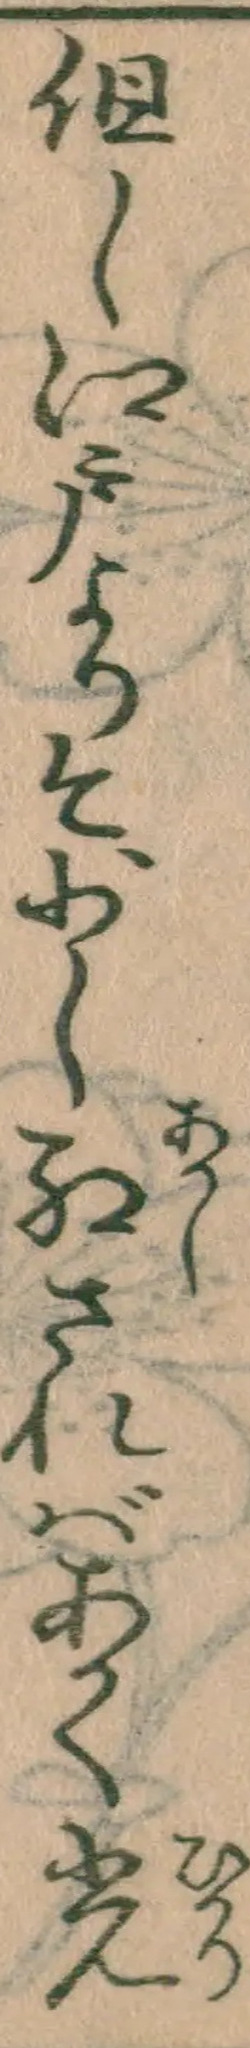但し江戸よりは少し紅さればあかく光
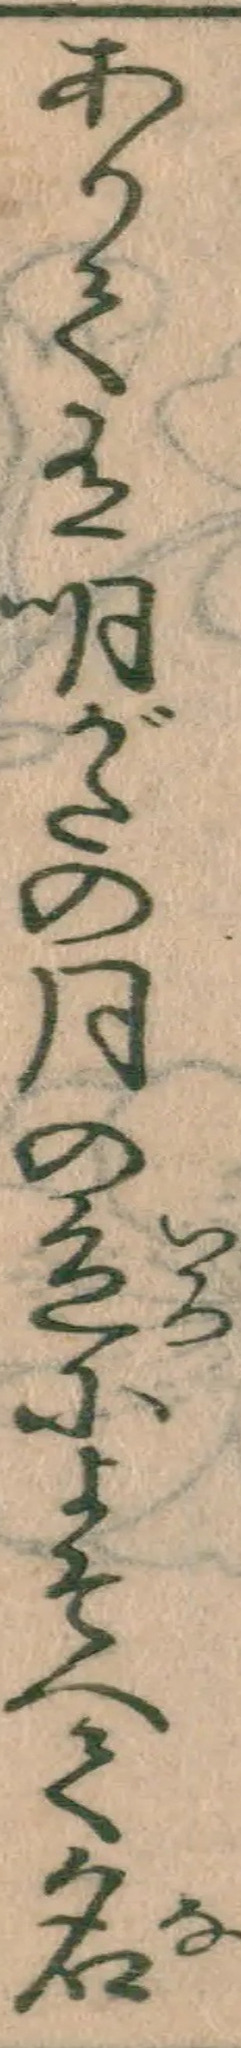ありて有明がたの月の色によそへて名

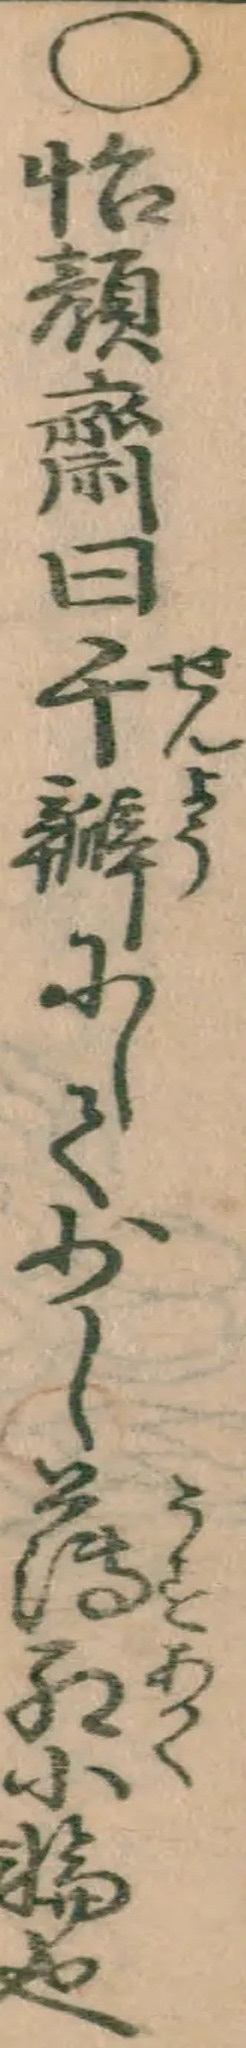○怡顔斎曰千弁にして少し薄紅小輪也
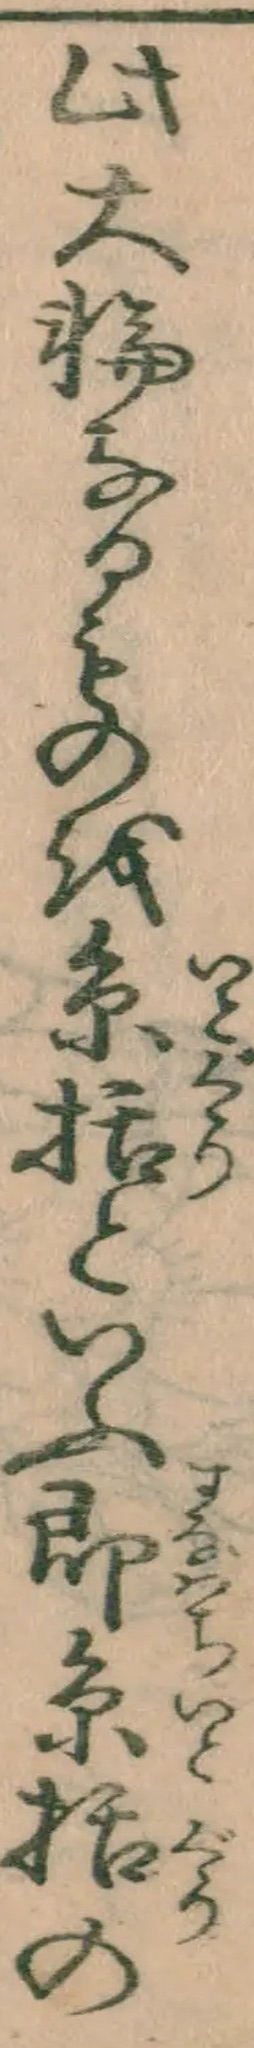此大輪なるものを糸括といふ即糸括の
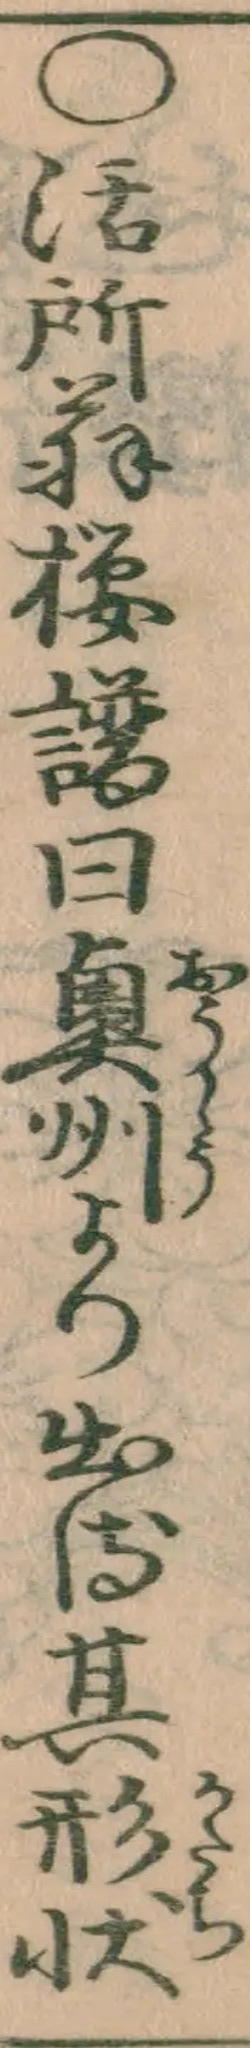○活所翁桜譜曰奥州より出る其形状
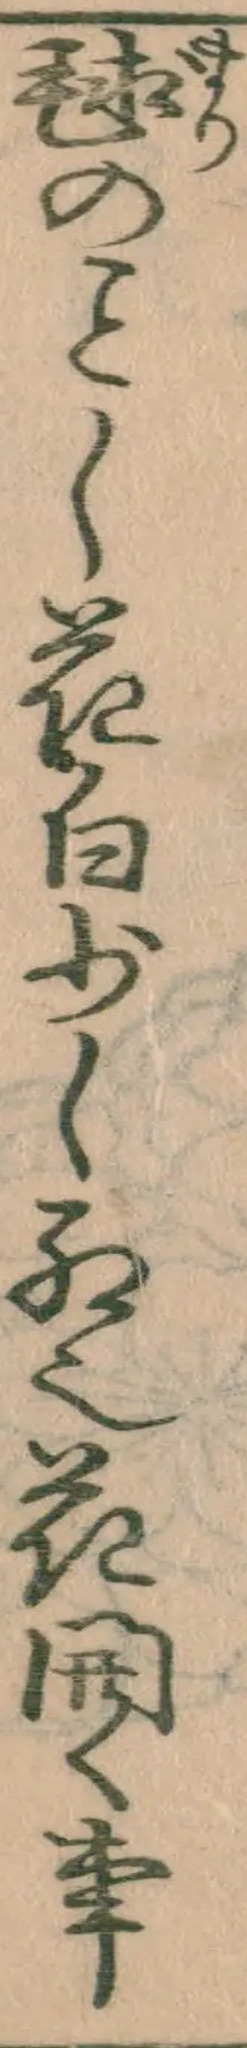毬のことし花白少し紅也花開く事
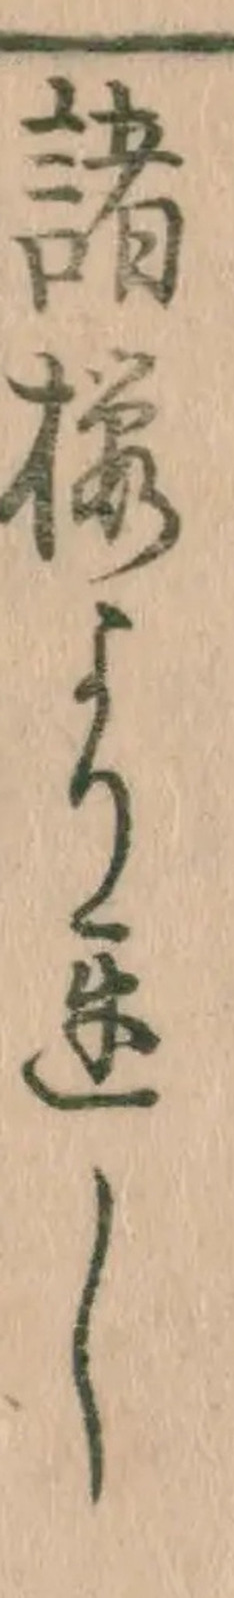諸桜より遅し

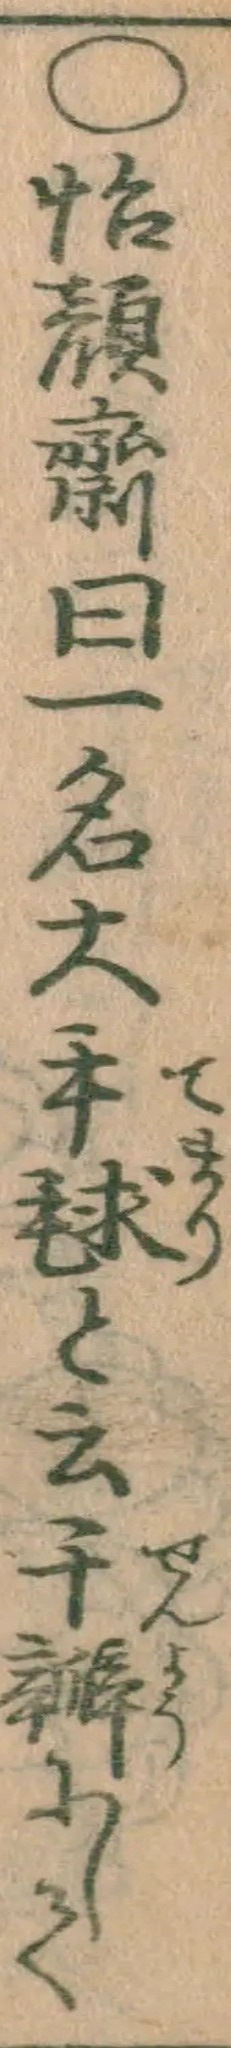○怡顔斎曰一名大手毬と云千弁にして
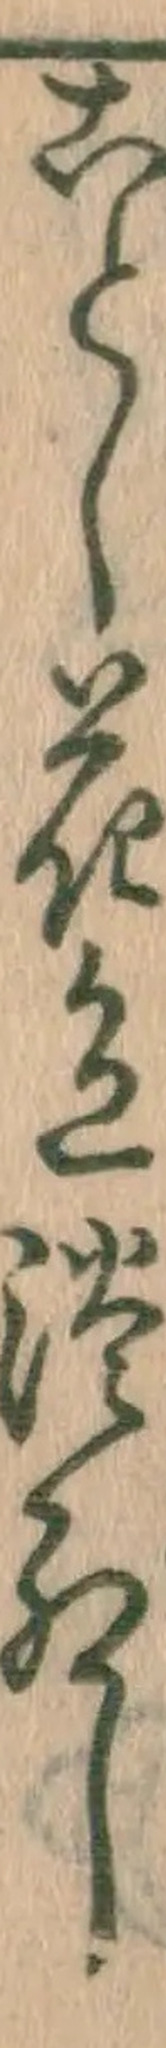ごとし花色淡紅し

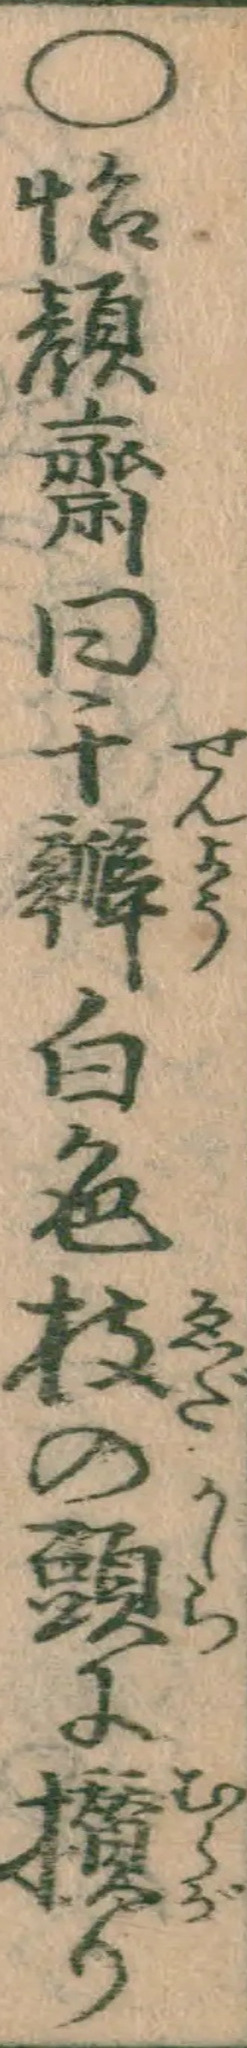○怡顔斎曰千弁白色枝の頭に攅り
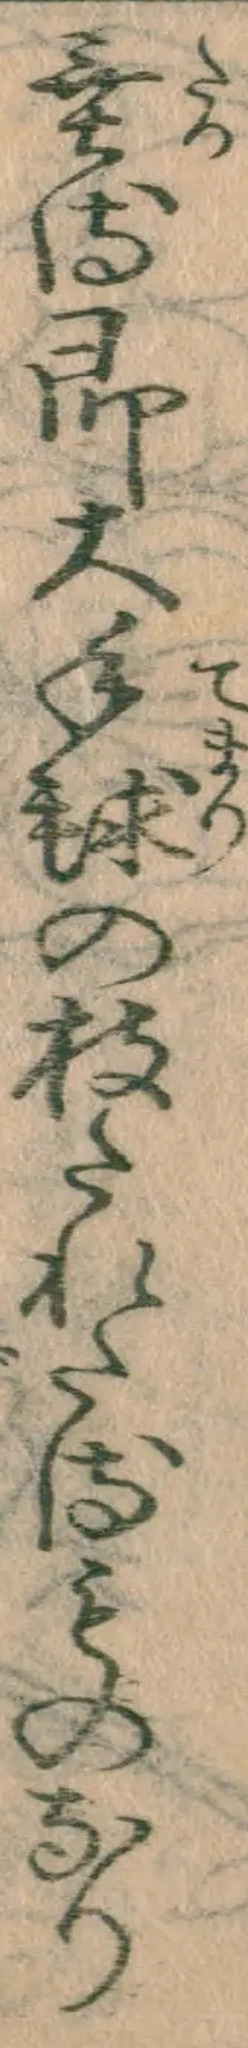垂る即大手毬の枝たれたるものなり
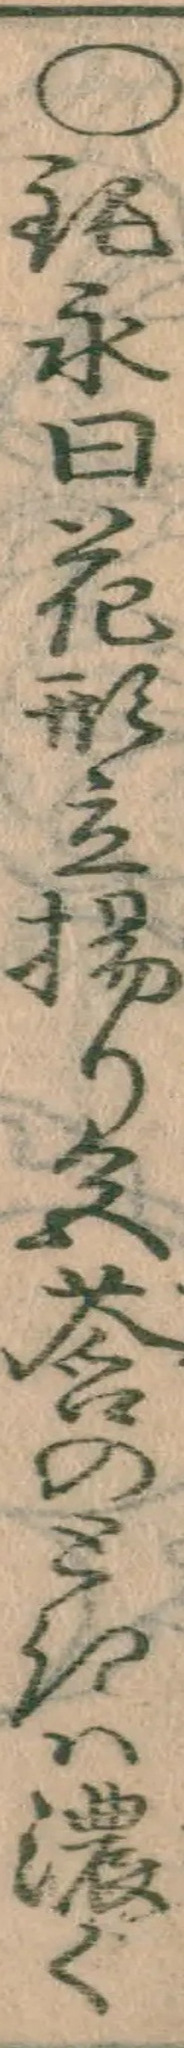○鈍永曰花形立揚り色莟のときは濃く
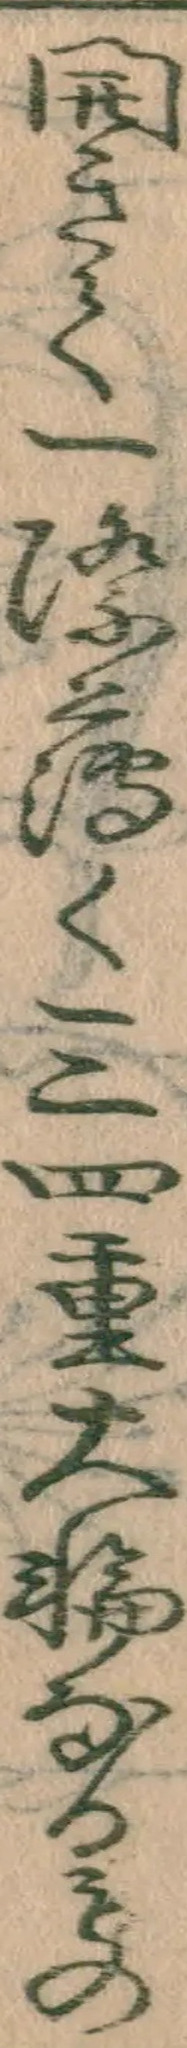開きて一際薄く三四重大輪なるもの
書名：怡顔齋櫻品
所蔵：国立国会図書館 National Diet Library, JAPAN
